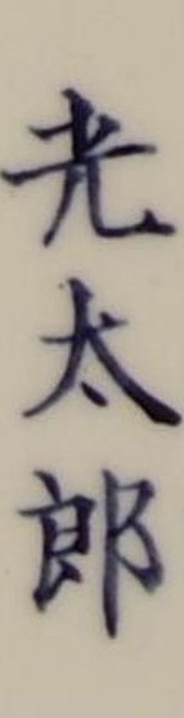光太郎
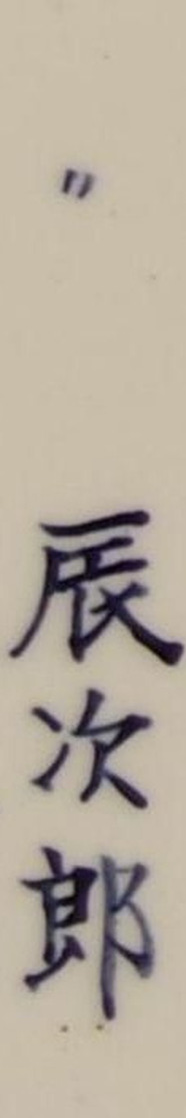辰次郎
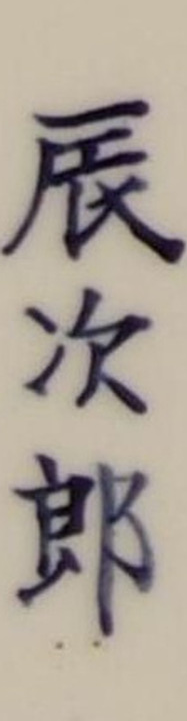辰次郎
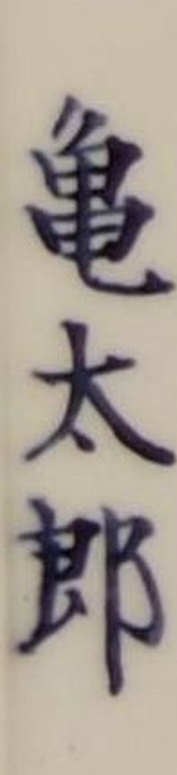亀太郎

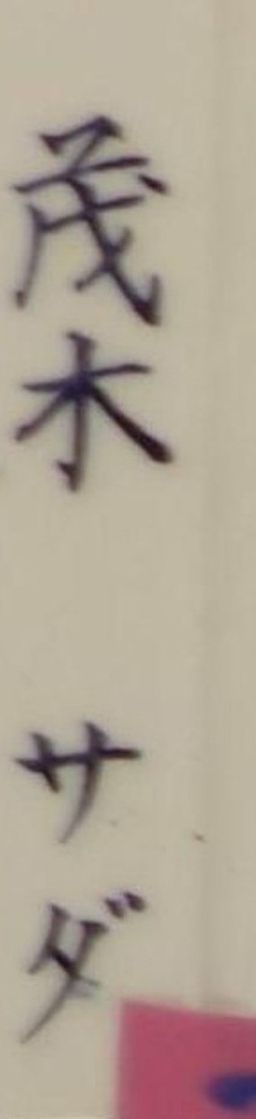茂木サダ
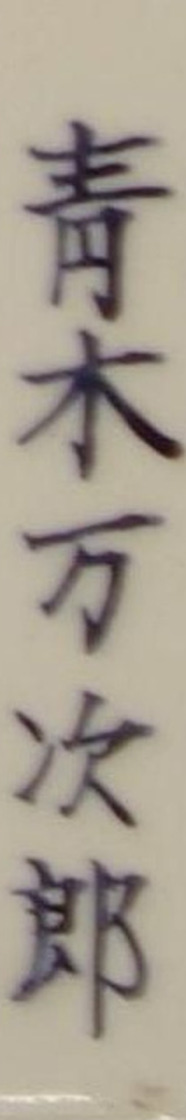青木万次郎
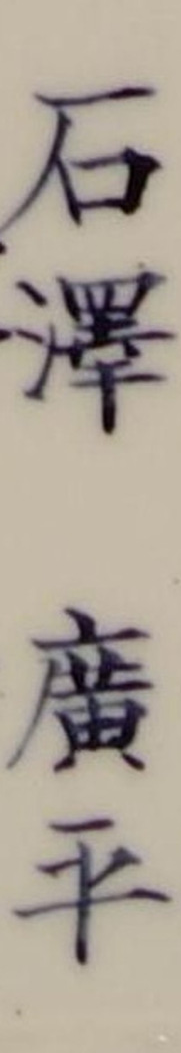石澤広平
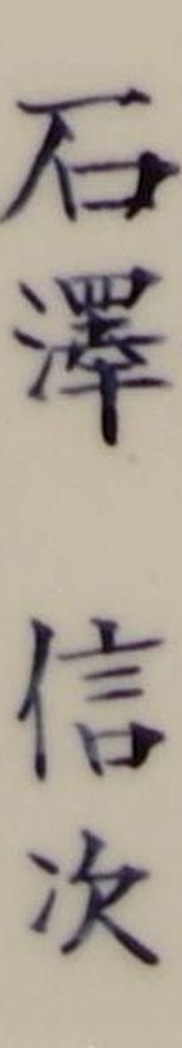石澤信次
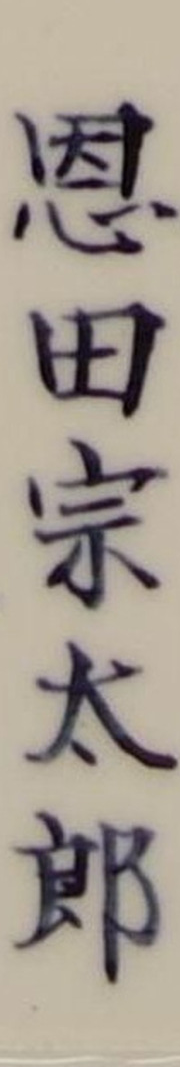恩田宗太郎
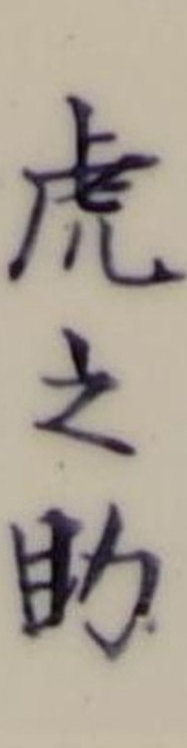虎之助
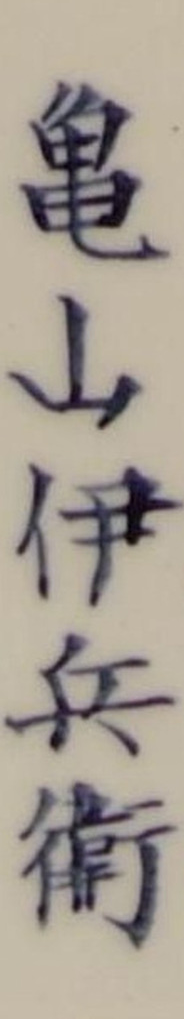亀山伊兵衛
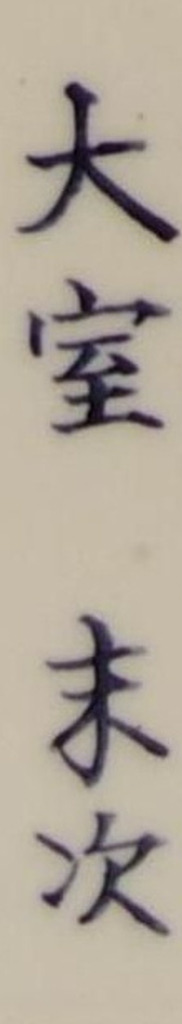大室末次
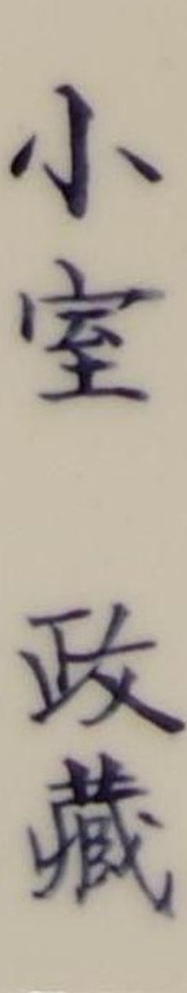小室政蔵
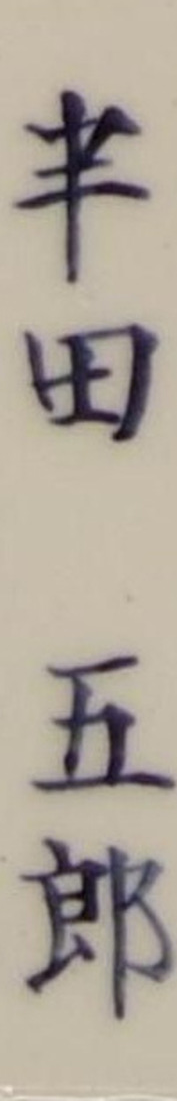半田五郎
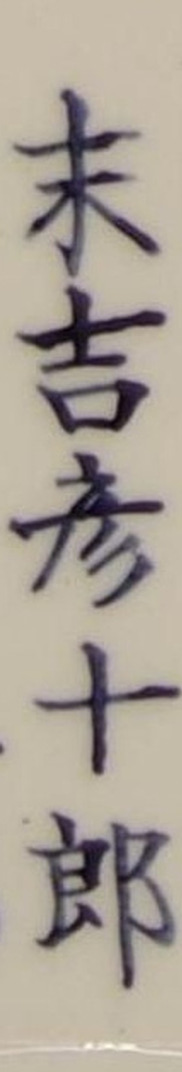末吉彦十郎
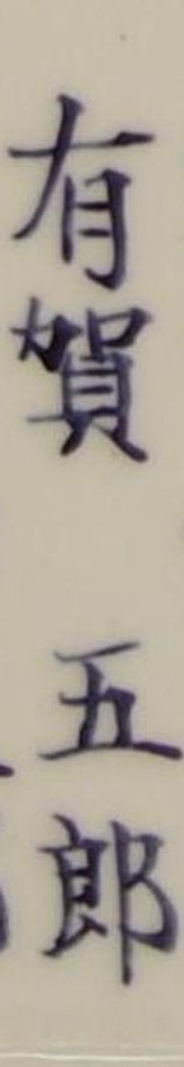有賀五郎
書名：M~S
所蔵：高野山金剛峯寺
